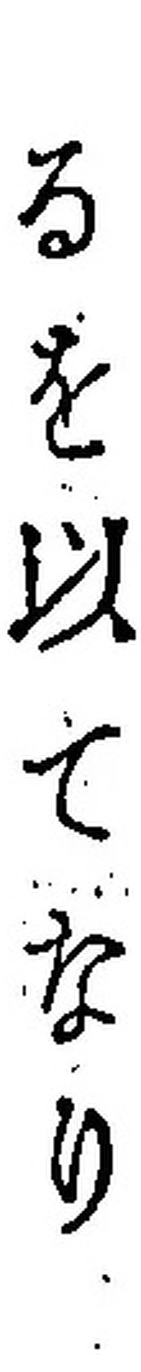るを以てなり
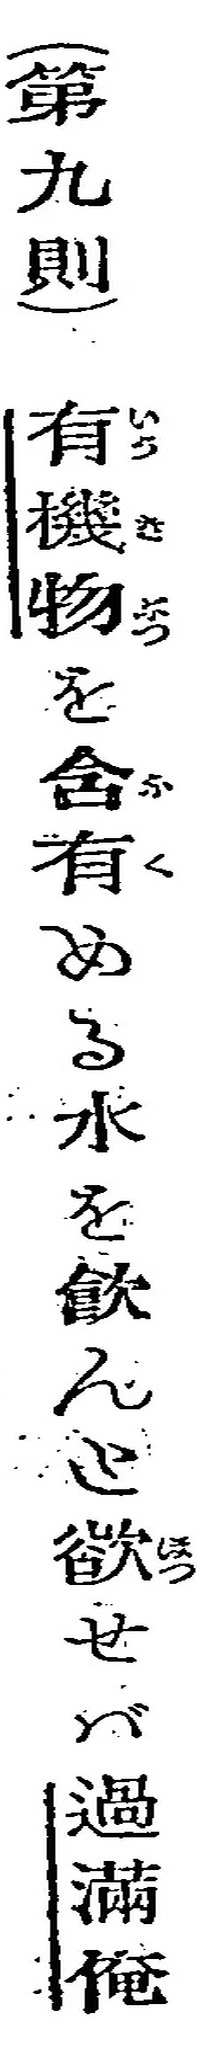[第九則]有機物を含有める水を飲んと欲せば過滿俺
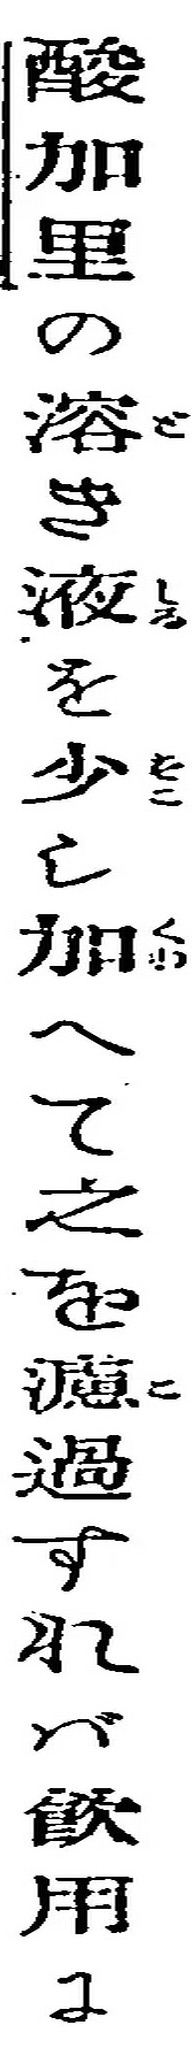酸加里の溶き液を少し加へて之を濾過すれば飲用に
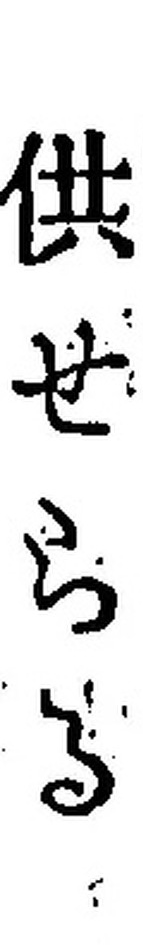供せらる
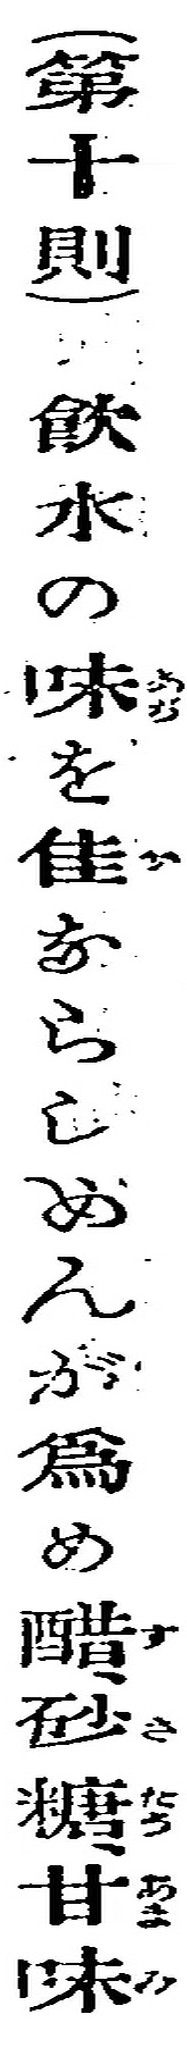[第十則]飲水の味を佳ならしめんが為め醋、砂糖、甘味
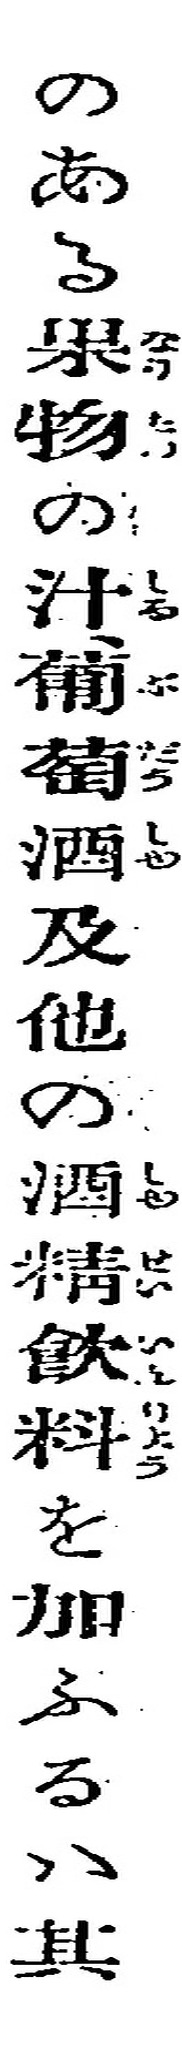のある果物の汁、葡萄酒及他の酒精飲料を加ふるは其
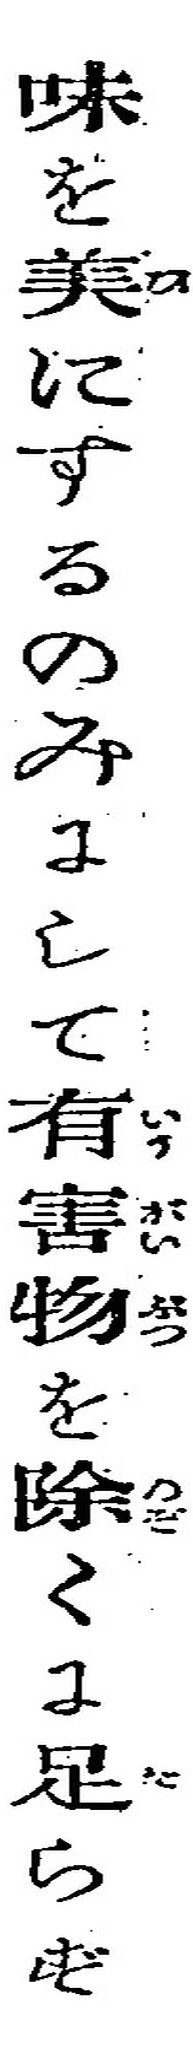味を美にするのみにして有害物を除くに足らず
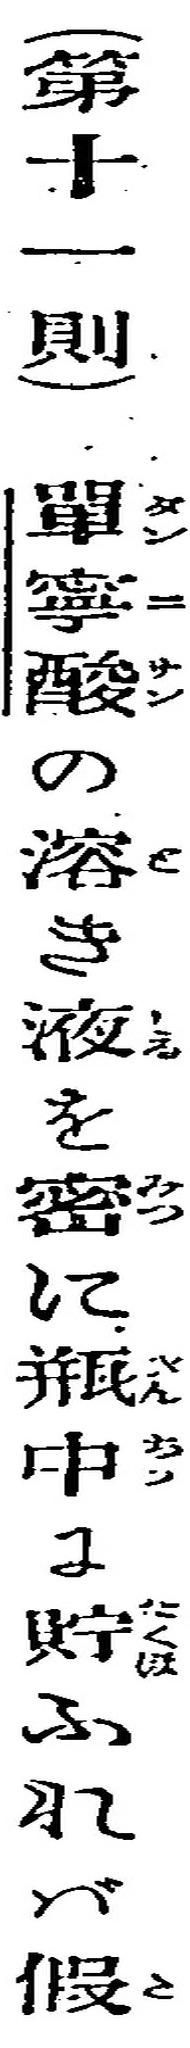[第十一則]單寧酸の溶き液を密に瓶中に貯ふれば假
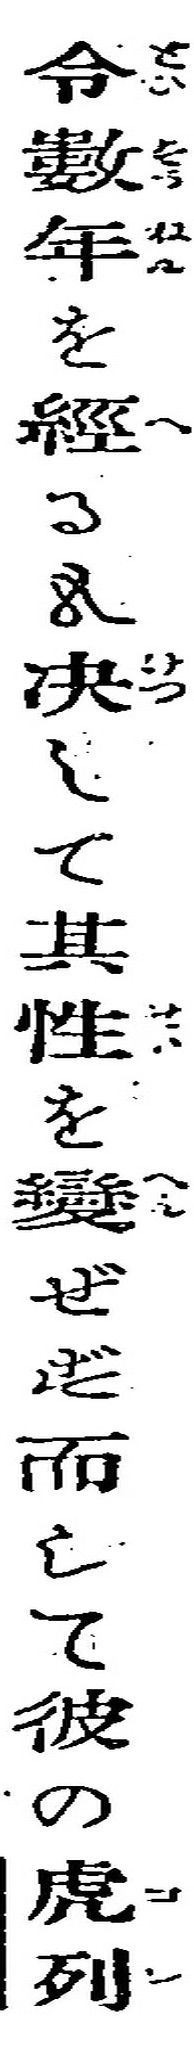令数年を経るも決して其性を變ぜす而して彼の虎列
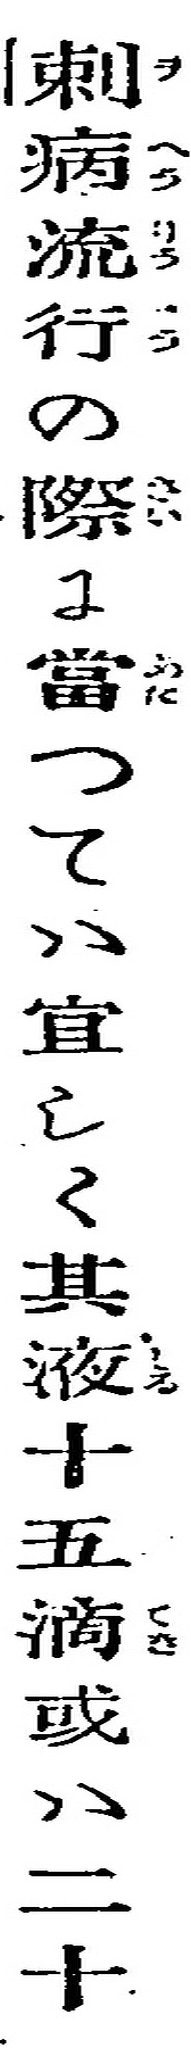刺病流行の際に当つては宜しく其液十五滴或は二十
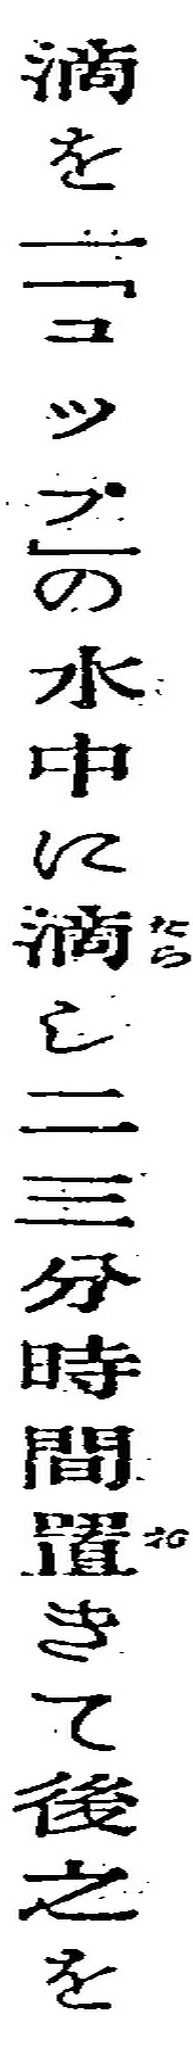滴を一[コツプ]の水中に滴し二三分時間置きて後之を
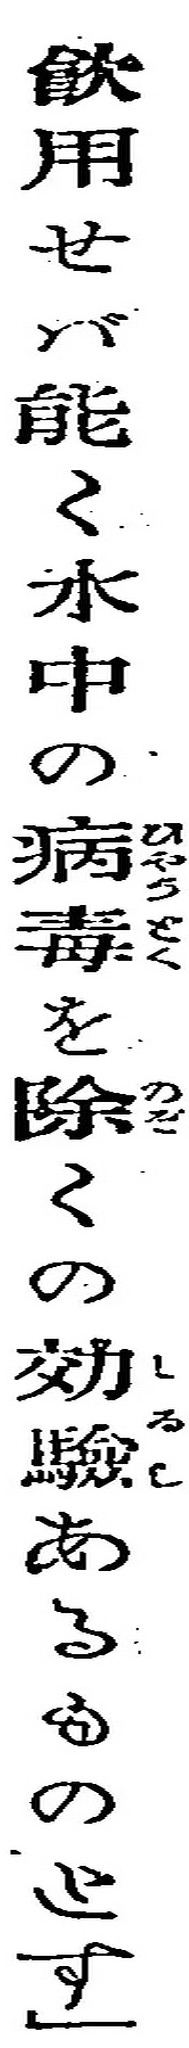飲用せば能く水中の病毒を除くの効験あるもんとす」

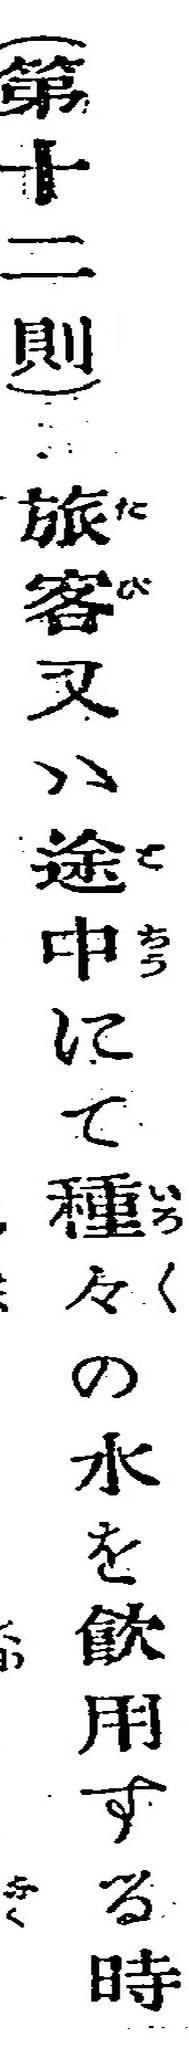[第十二則]旅客又は途中にて種々の水を飲用する時
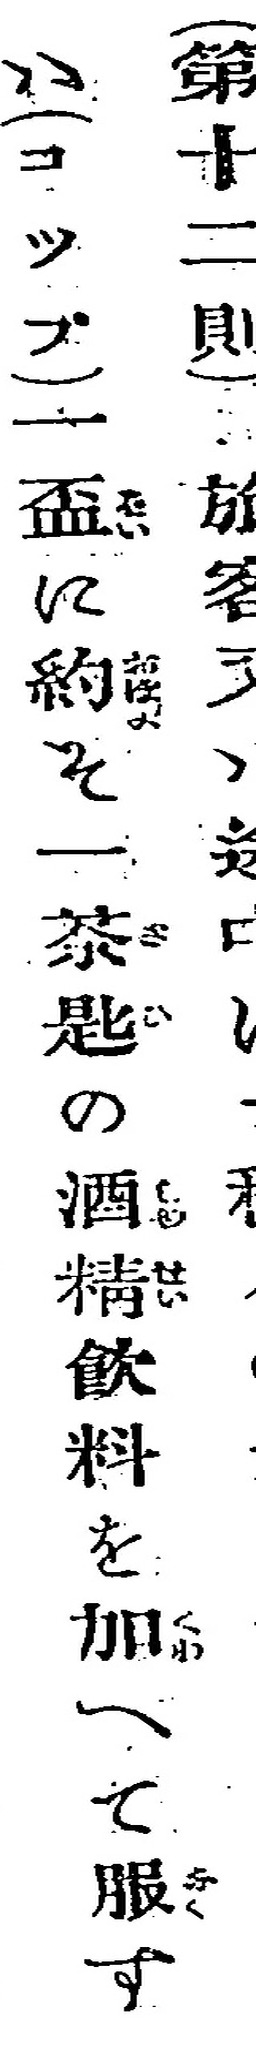は[コツプ]一盃に約そ一茶匙の酒精飲料を加へて服す
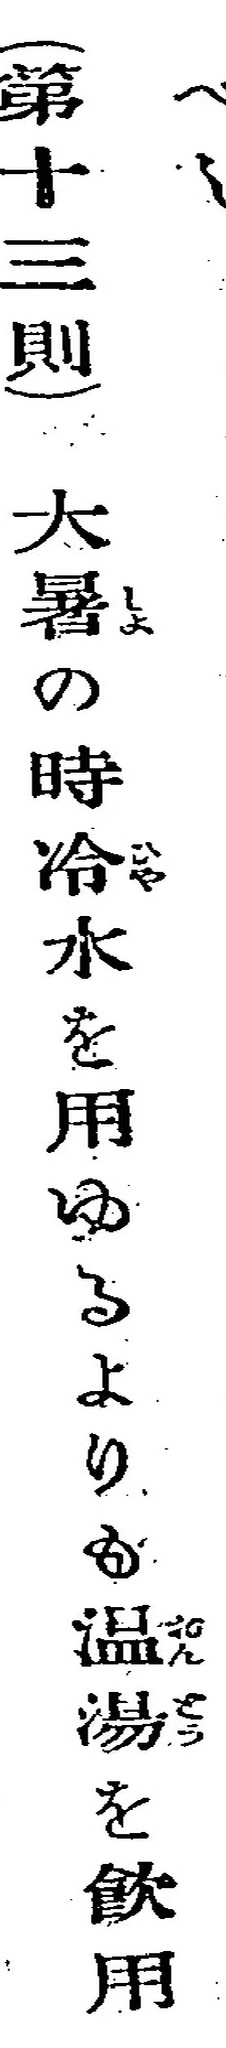[第十三則]大暑の時冷水を用ゆるよりも温湯を飲用
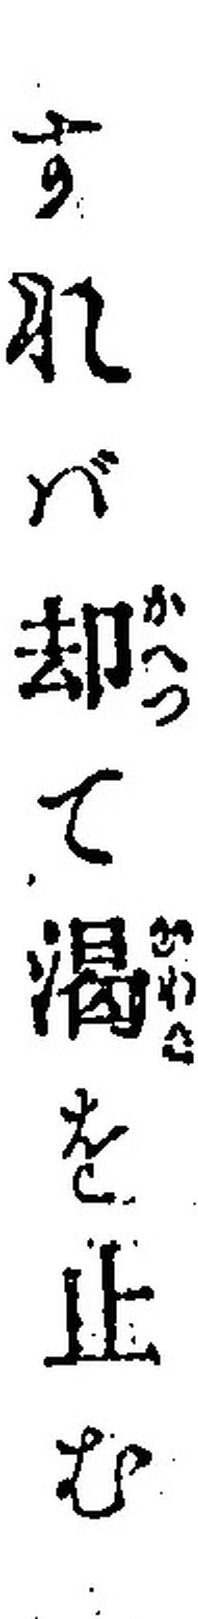すれば却て渇を止む
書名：飲水の心得 : 伝染病の予防
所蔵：国立国会図書館 National Diet Library, JAPAN
